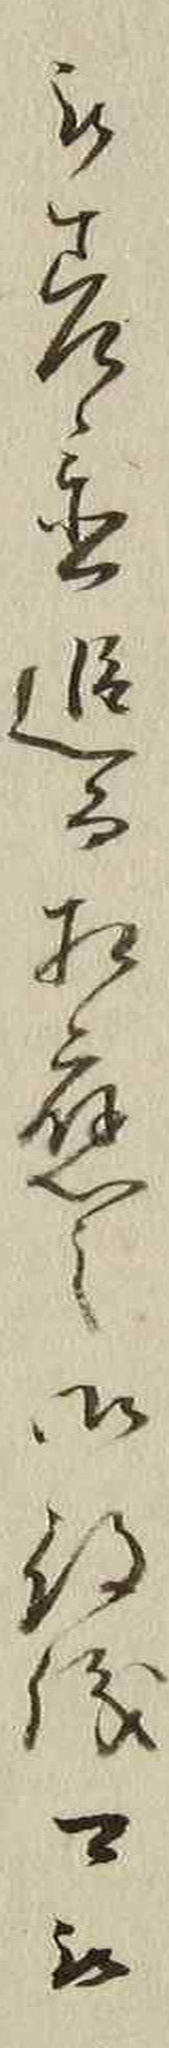被差置追而相応之御役儀可被
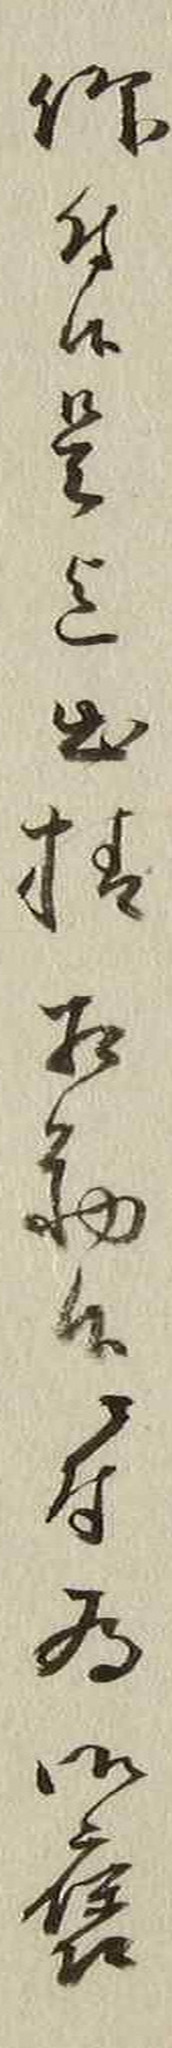仰付候是迄出精相勤候ニ付為御褒
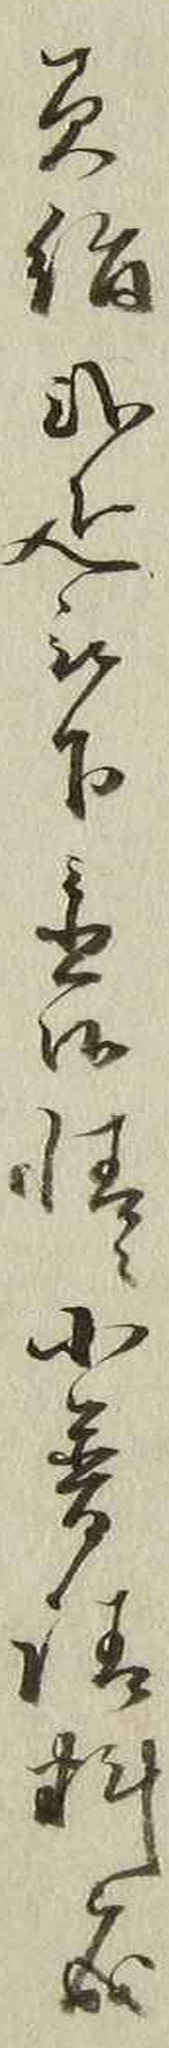美絹弐疋被下置候情ニ小普請料被成
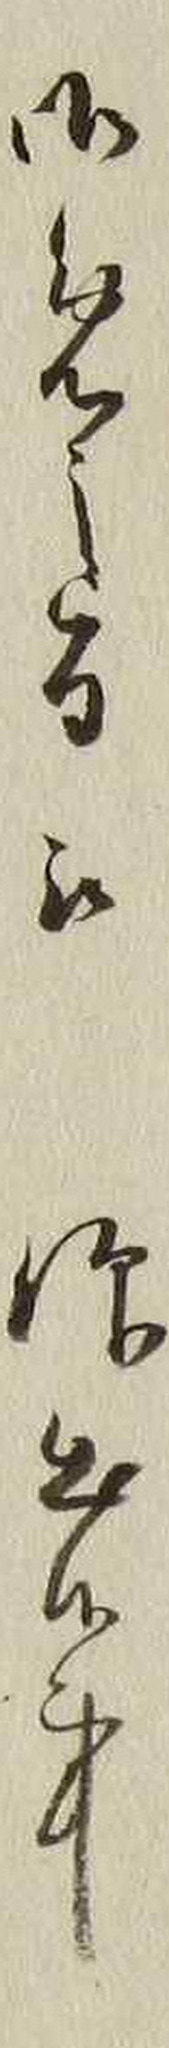御免之旨被仰出候事
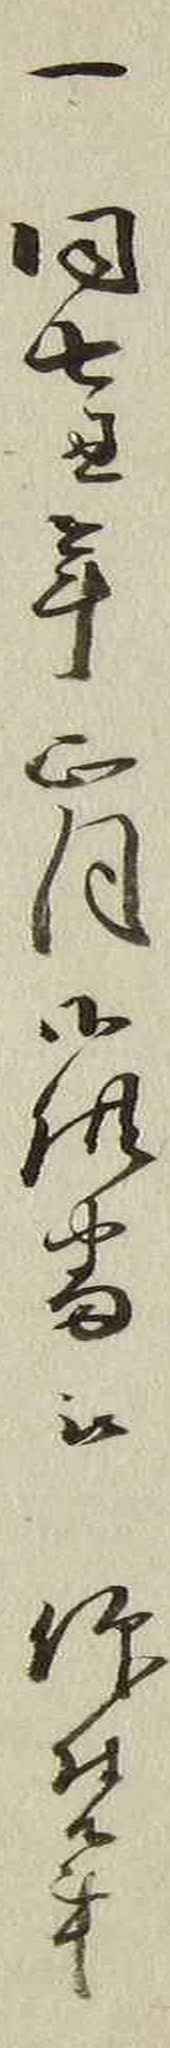一同七丑年正月御供番被仰付候事
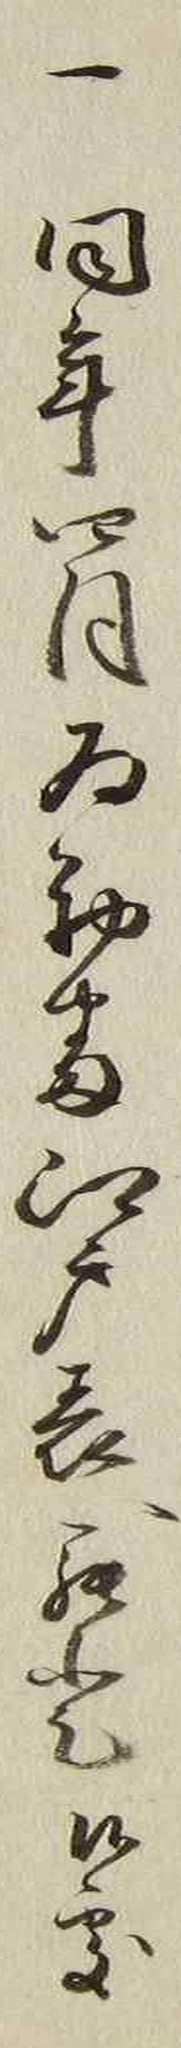一同年四月為勤番江戸表へ罷登候処
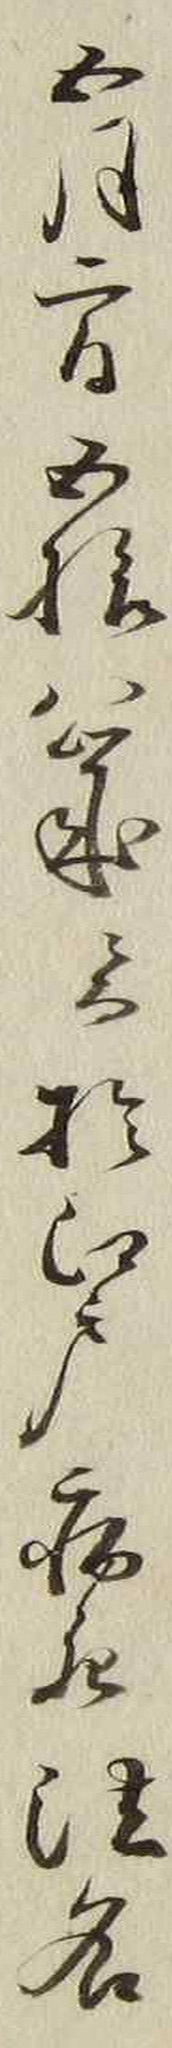五月二日五拾八歳ニ而於江戸病死法名
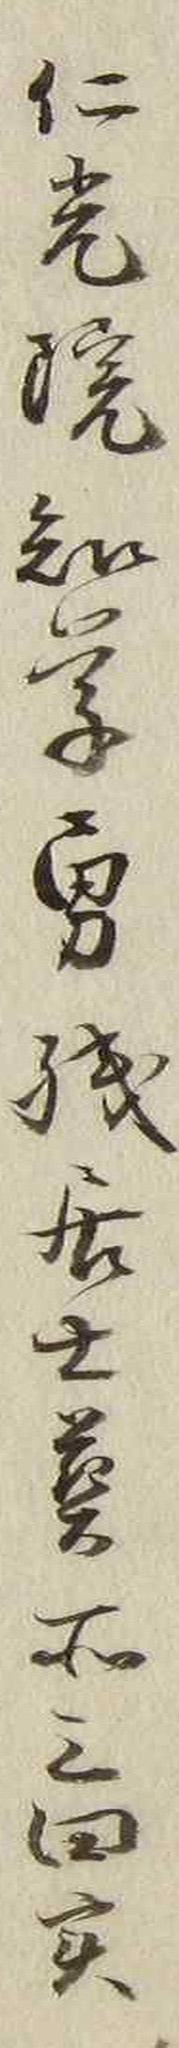仁光院知学勇残居士葬所三田実

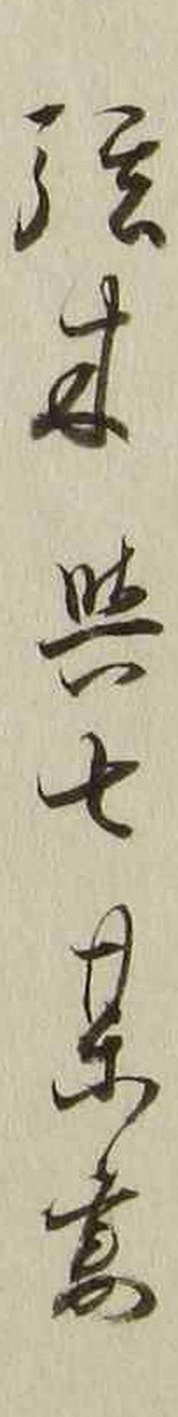女弦木與七某妻
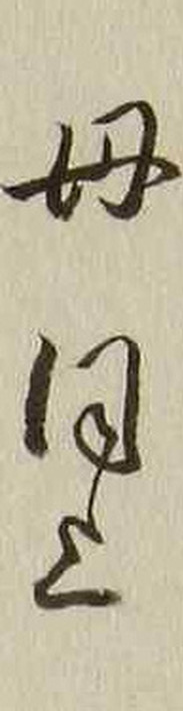母同上
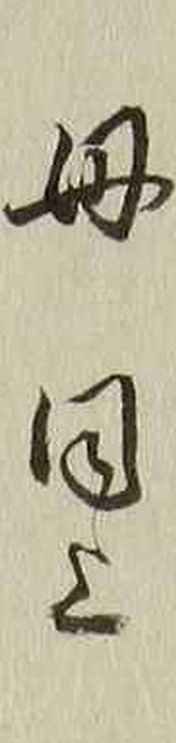母同上
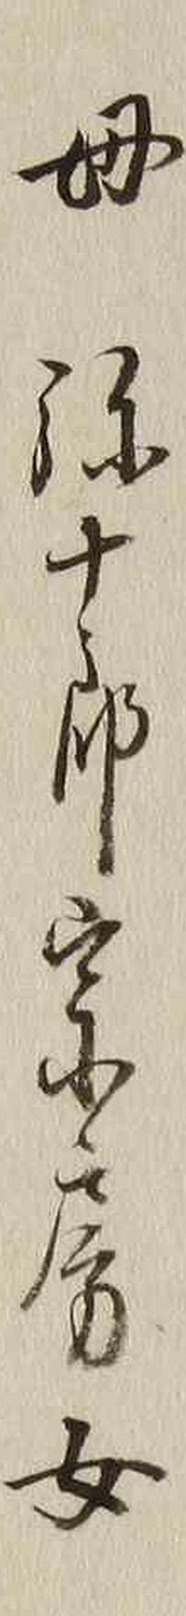母弥十郎宗房女
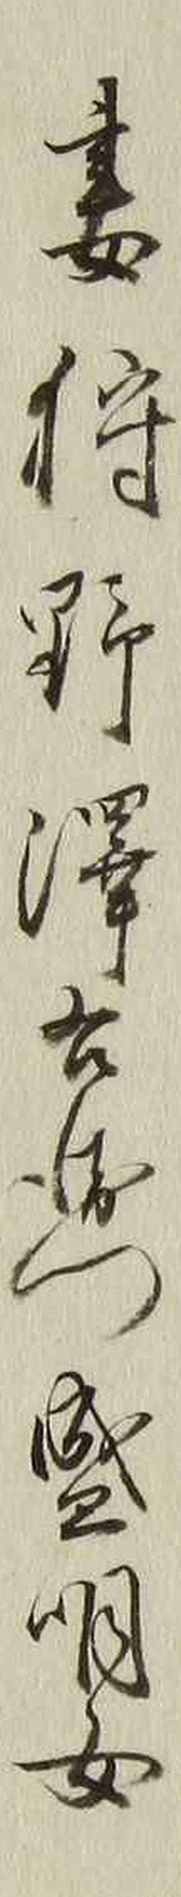妻狩野沢右衛門盛明女
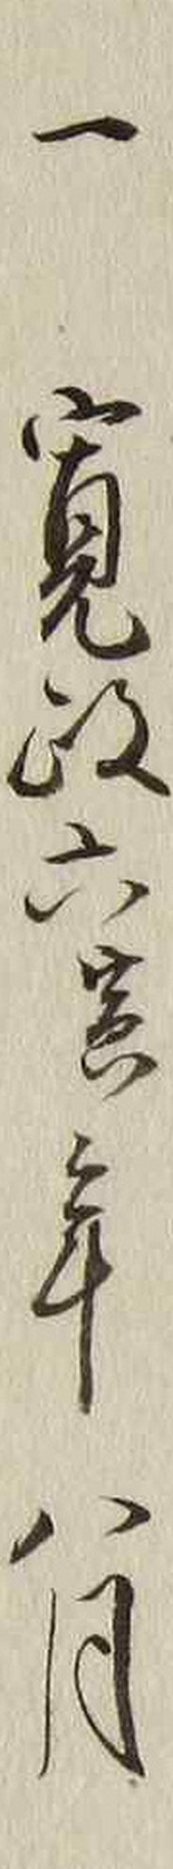一寛政六寅年八月
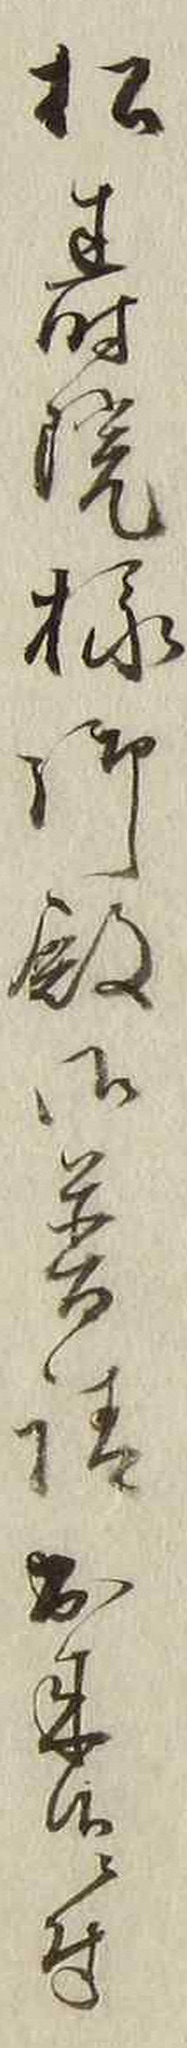松寿院様御殿御普請出来候ニ付
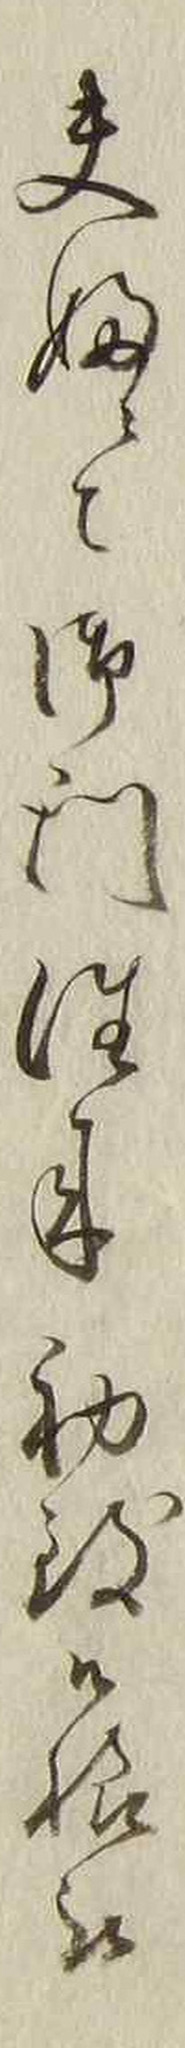夫婦ニて御門往来初致候様被
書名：諸士系譜　巻之28　い之部28
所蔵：会津若松市立会津図書館
